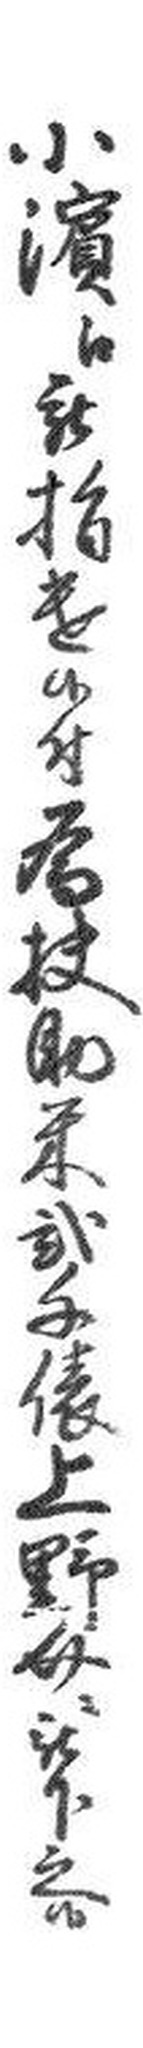小浜江被指遣候付為扶助米弐千俵上野介ニ被下之候
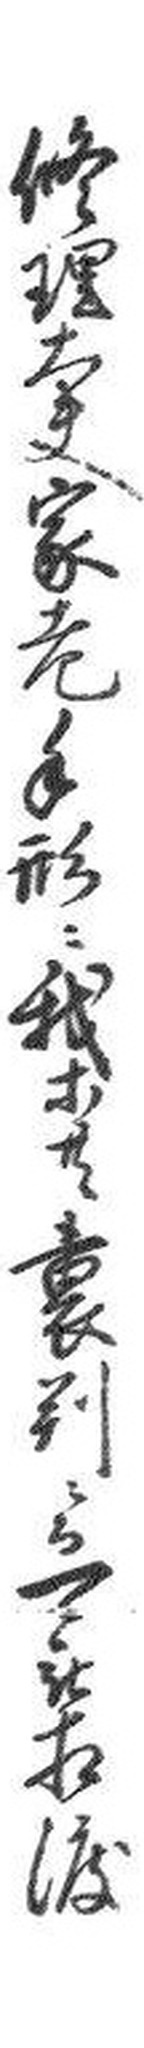修理大夫家老手形ニ我等共裏判ニ而可被相渡
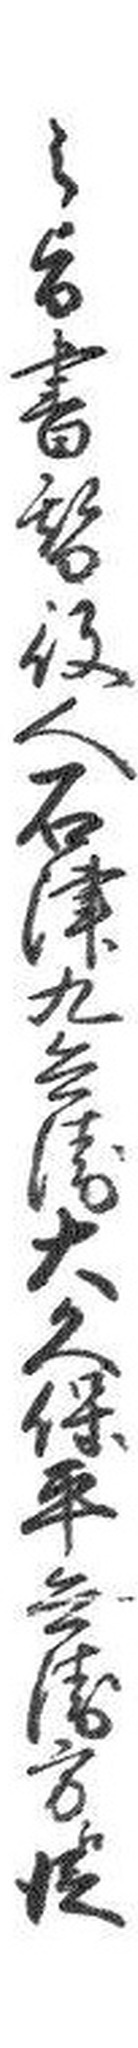之旨書替役人石津九兵衛大久保平兵衛方江従
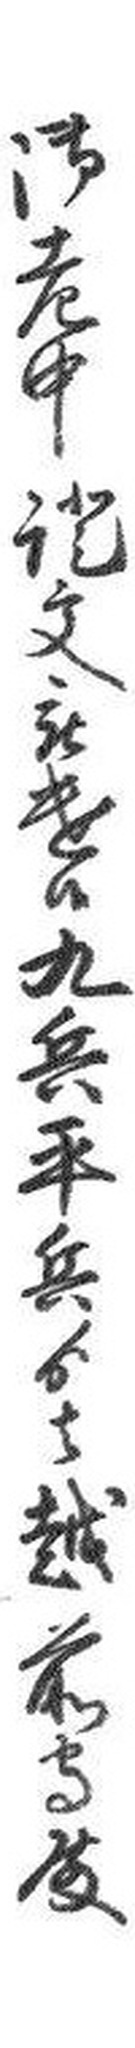御老中證文被遣候九兵平兵ゟ者越前守殿
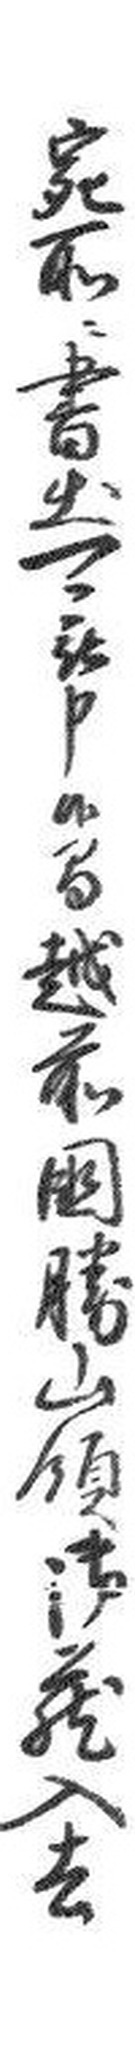宛所ニ書出可被申候間越前国勝山領御蔵入去
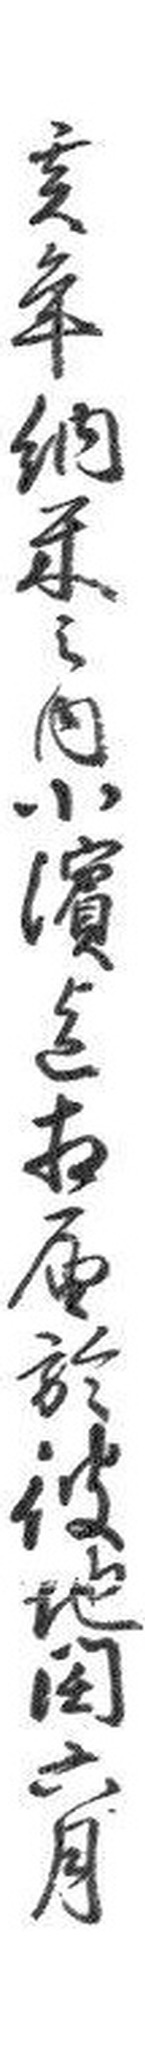亥年納米之内小浜迄相届於彼地閏六月
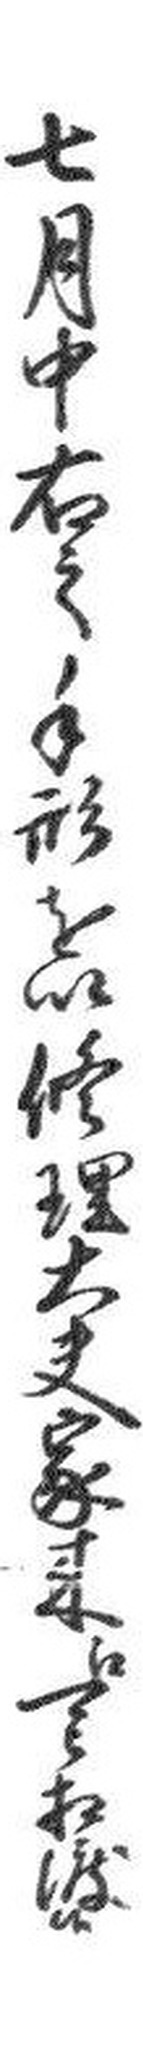七月中右之手形を以修理大夫家来江可被相渡候
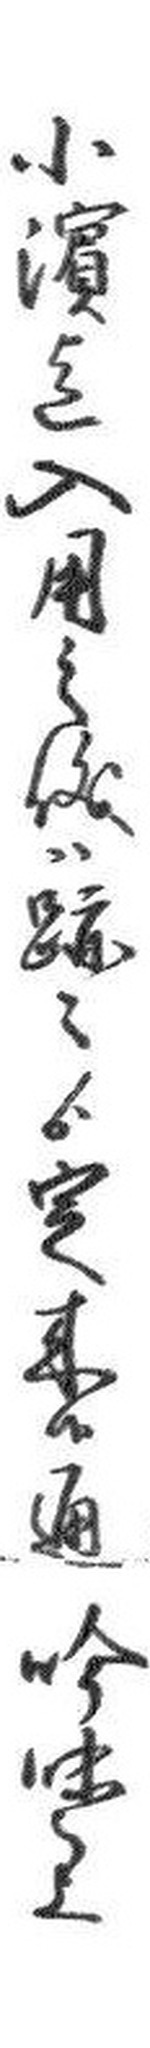小浜迄入用之儀は跡々ゟ定来候通吟味之上
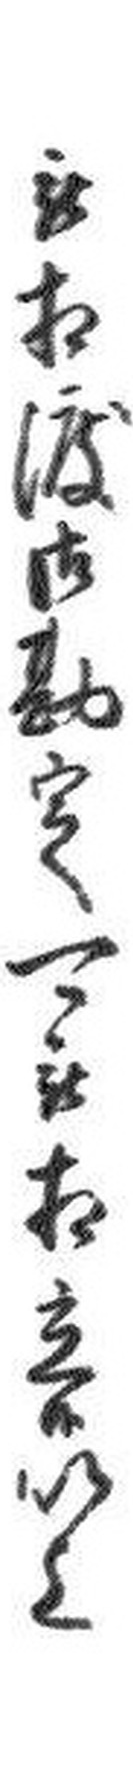被相渡御勘定可被相立候以上
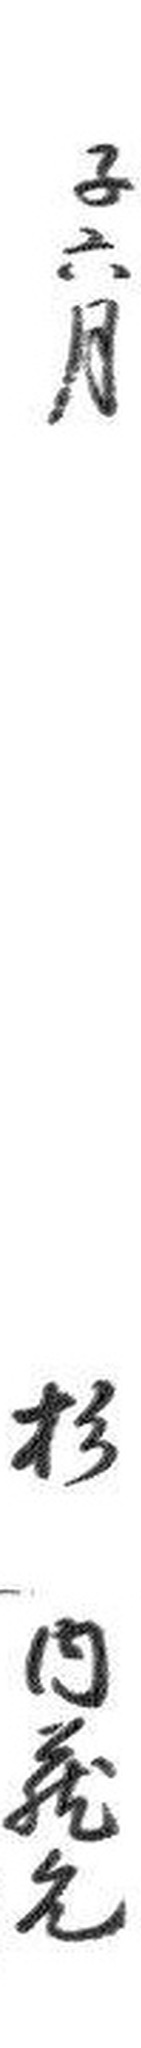子六月杉内蔵允
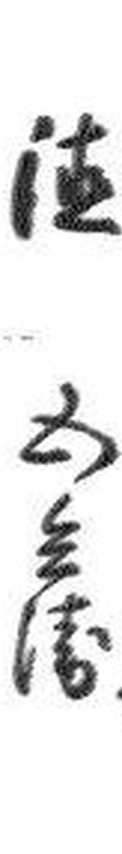徳五兵衛
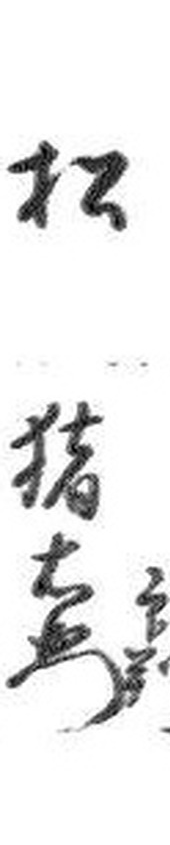松猪右衛門
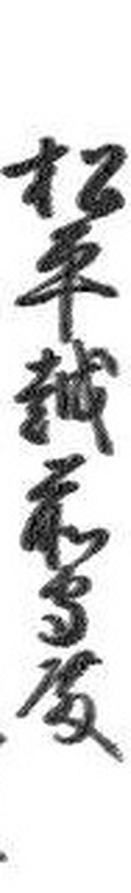松平越前守殿
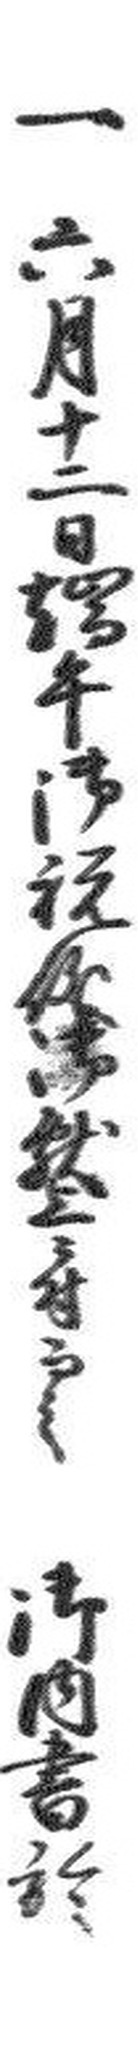一六月十二日端午御祝儀御献上ニ付而之御内書於
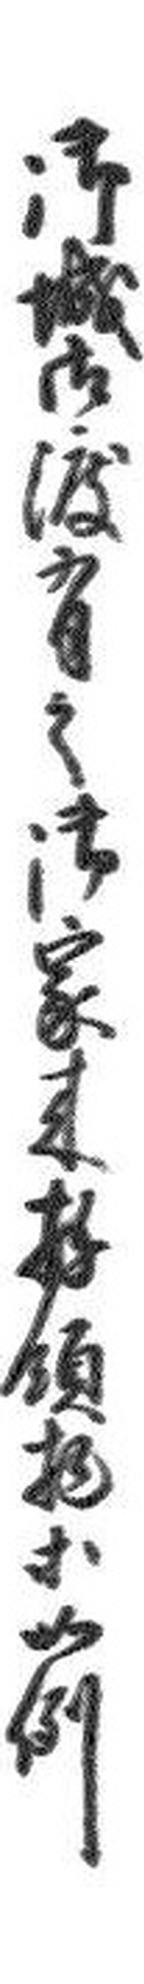御城御渡有之御家来拝領物等如例
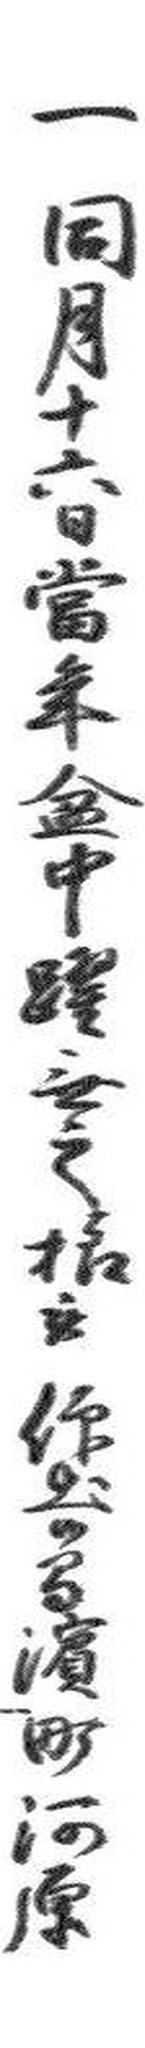一同月十六日当年盆中躍無之様被仰出候間浜町河原
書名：家譜 八 光通公 従寛文十年到同十二年
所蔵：福井県文書館 Fukui Prefectural Archives
